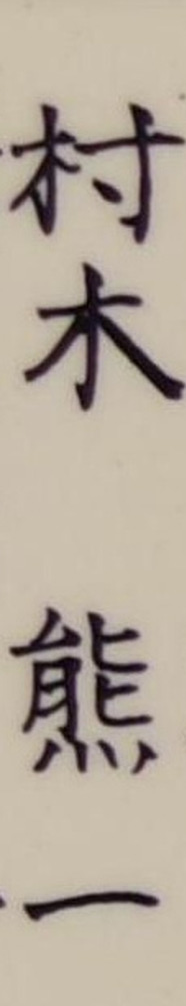村木熊一
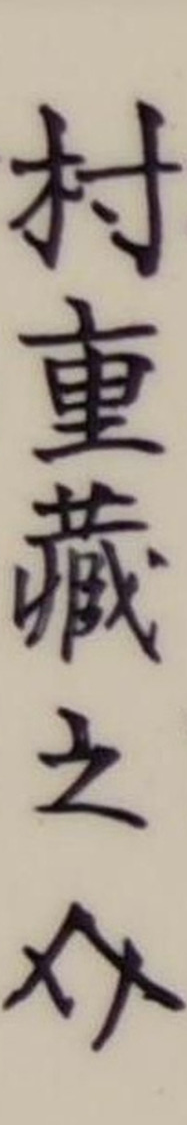中村蔵之介
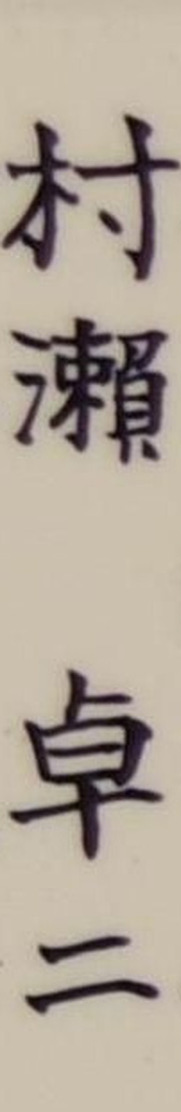村瀨卓二
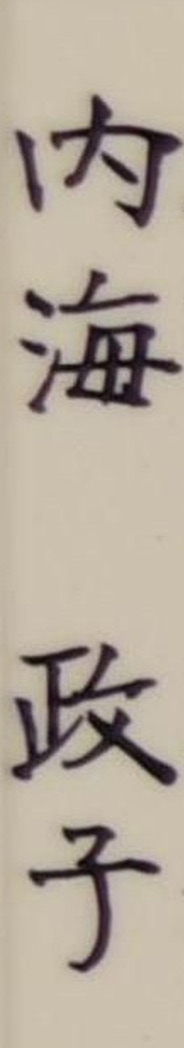内海政子

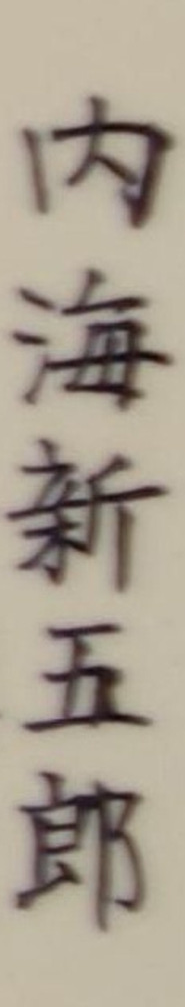内海新五郎
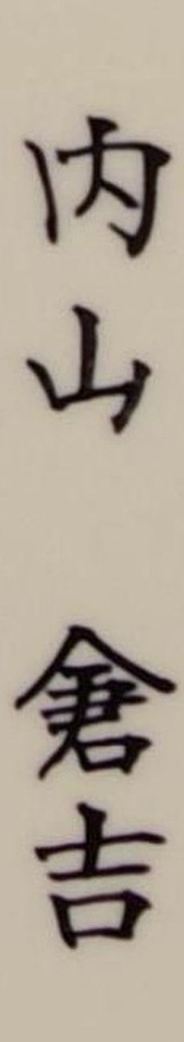内山倉吉
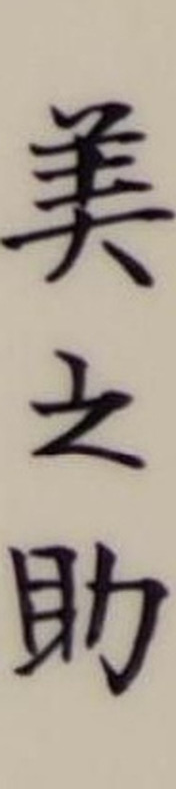美之助
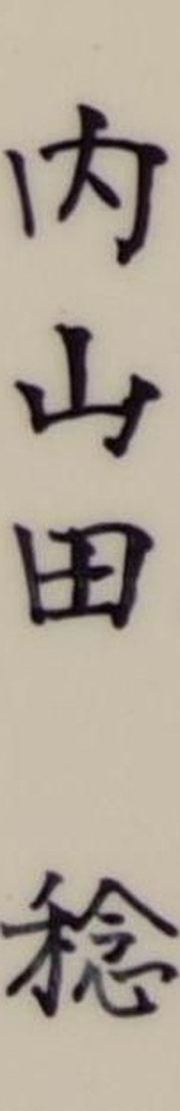内山田稔
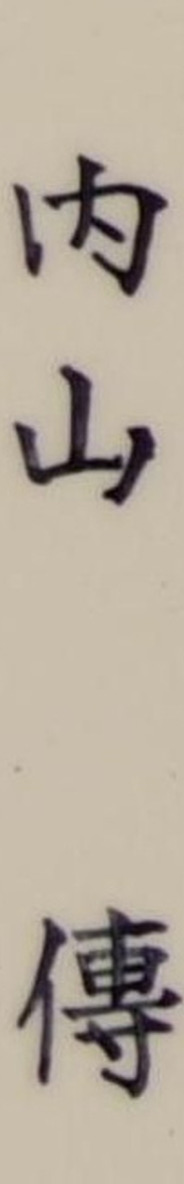内山傳

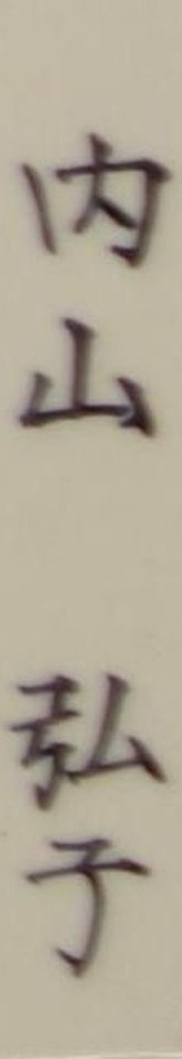内山弘子
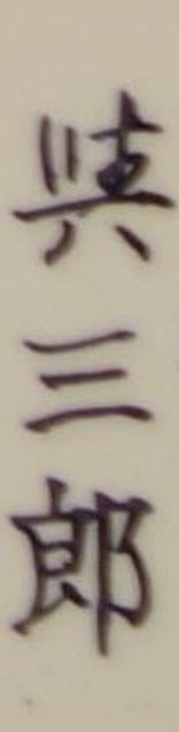与三郎
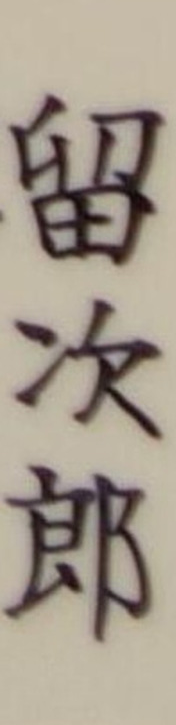留次郎
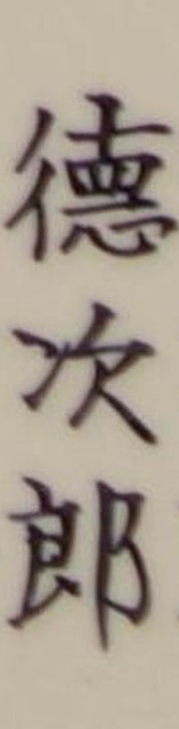徳次郎
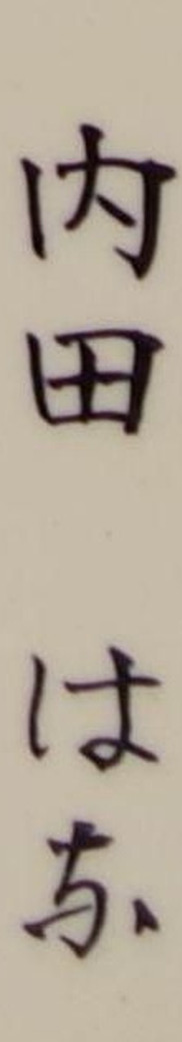内田はな
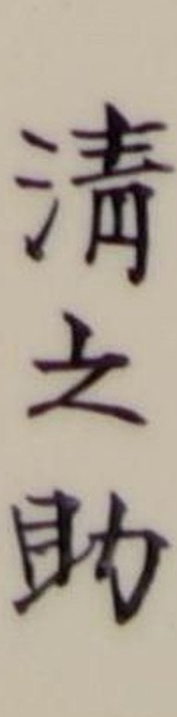清之助
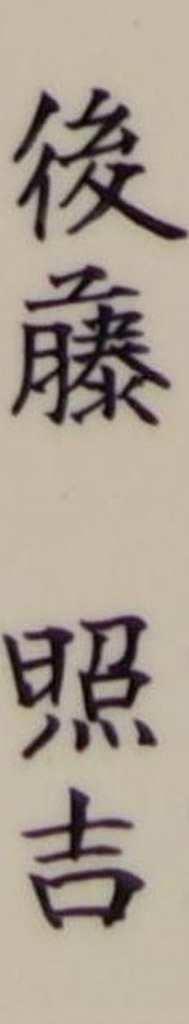後藤照吉
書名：M~S
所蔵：高野山金剛峯寺
